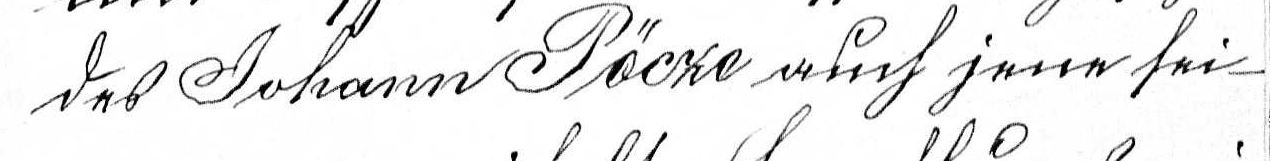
des Johann Pöcze auch jene sei¬
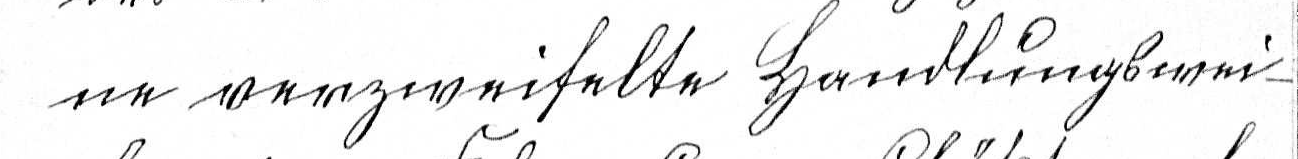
ne verzweifelte Handlungswei¬
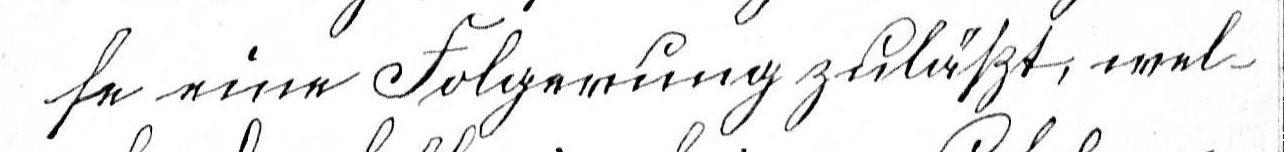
se eine Folgerung zuläßt, wel¬
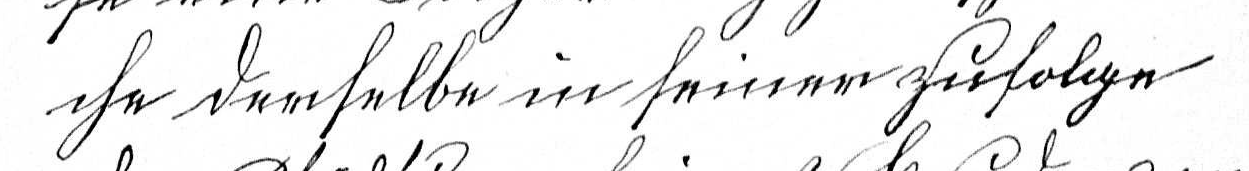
che derselbe in seiner zufolge
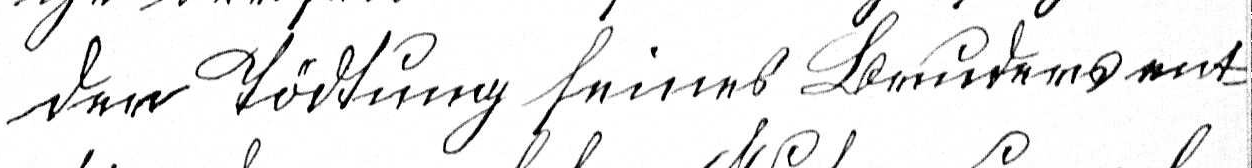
der Tödtung seines Bruders ent¬
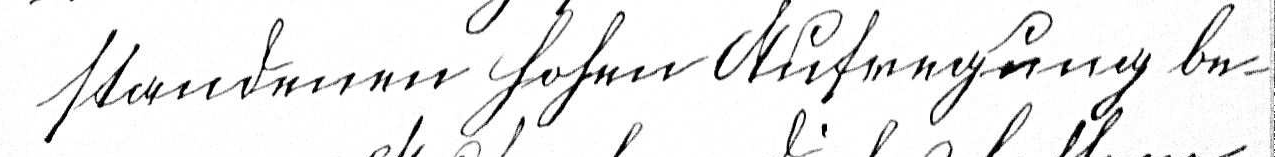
standenen hohen Aufregung be¬
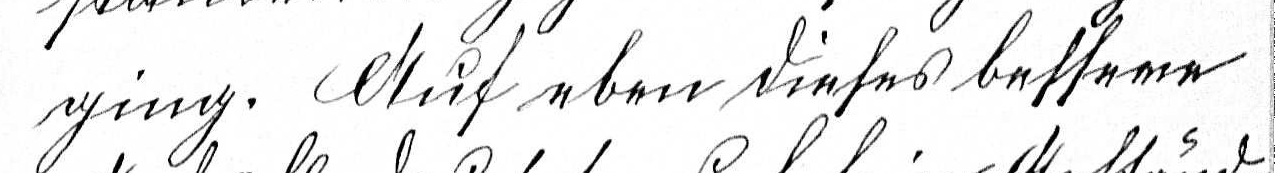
ging. Auf eben dieses bessere
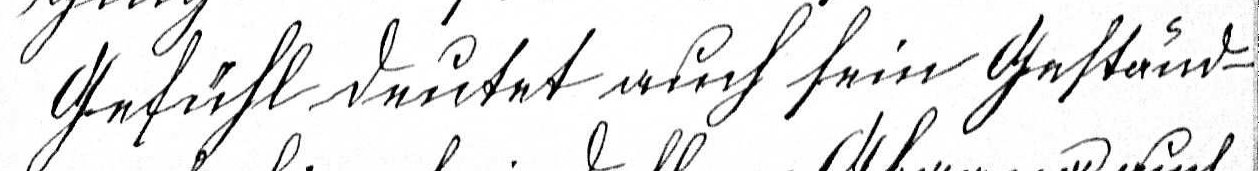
Gefühl deutet auch sein Geständ¬
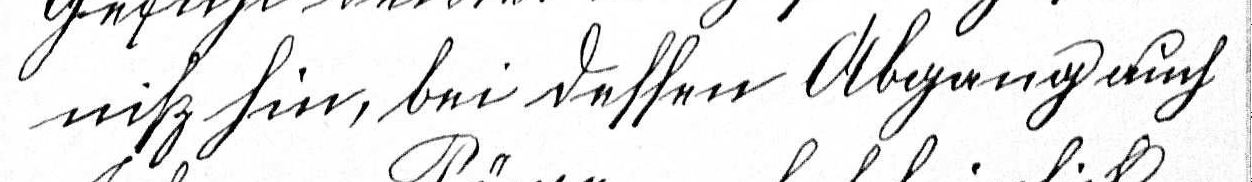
niß hin, bei dessen Abgang auch
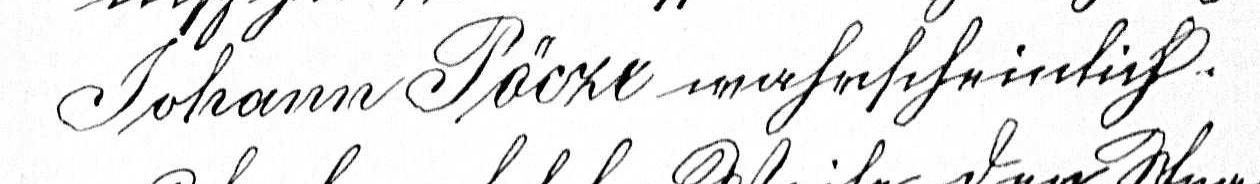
Johann Pöcze wahrscheinlich
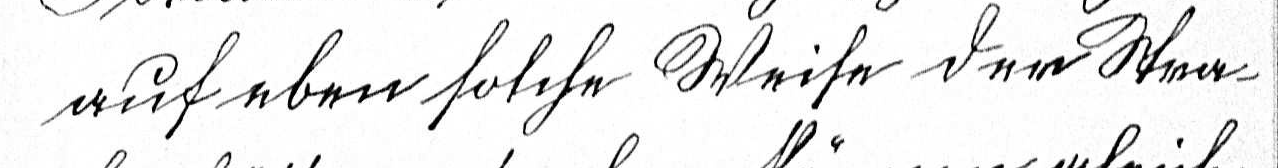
auf eben solche Weise der Stra¬
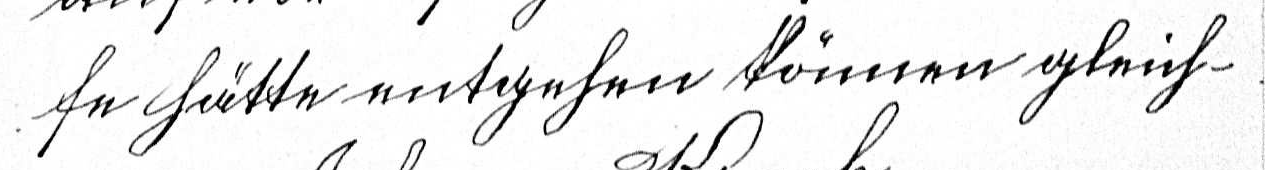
fe hätte entgehen können gleich
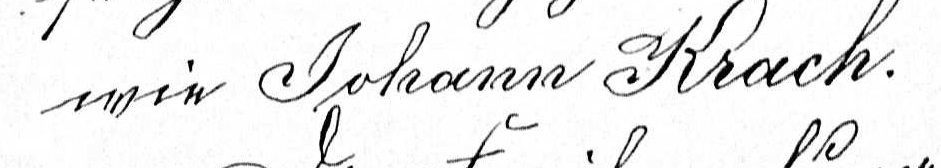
wie Johann Krach.
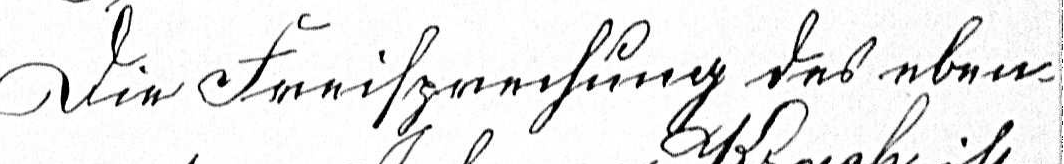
Die Freisprechung des eben¬
